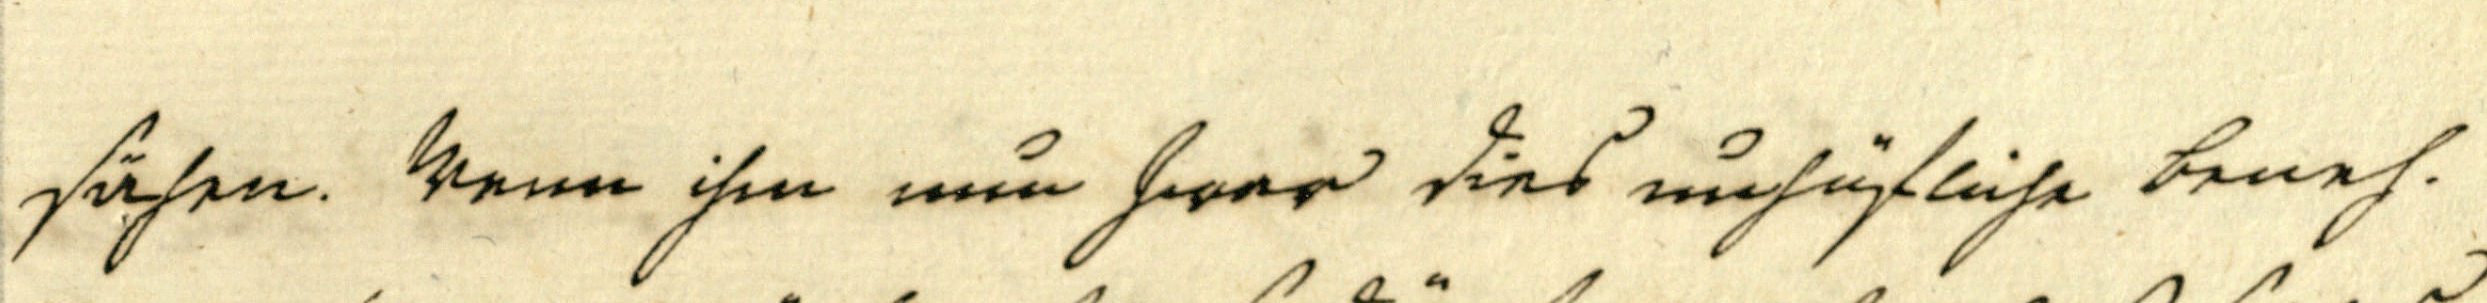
sähen. Wenn ihm nun zwar des unhöfliche Beneh¬
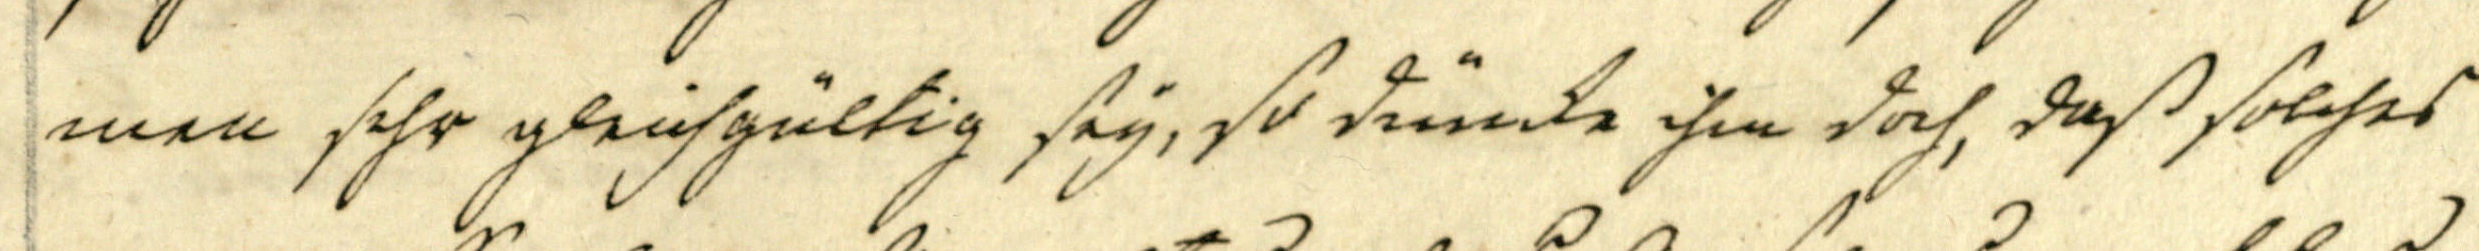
men sehr gleichgültig seÿ, so düncke ihm doch, daß solches
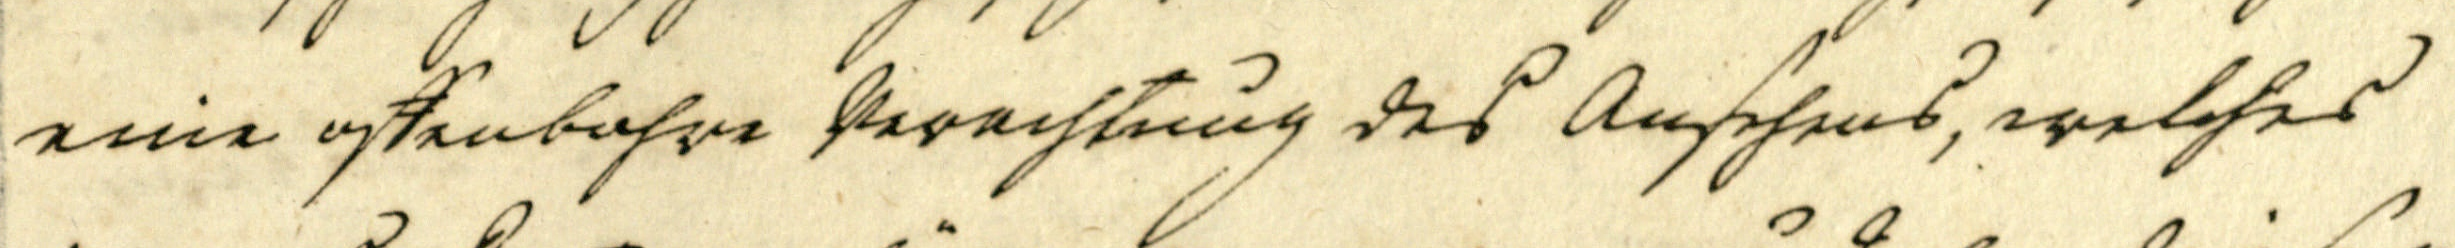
eine offenbahre Verachtung des Ansehens, welches
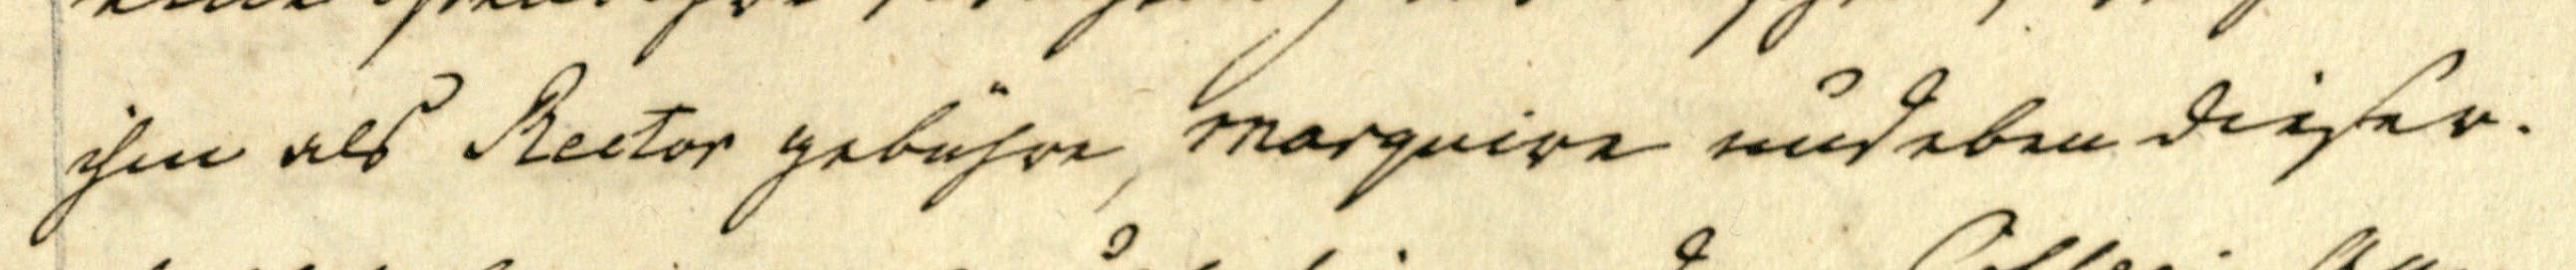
ihm als Rector gebühre, marquire und eben dieser¬
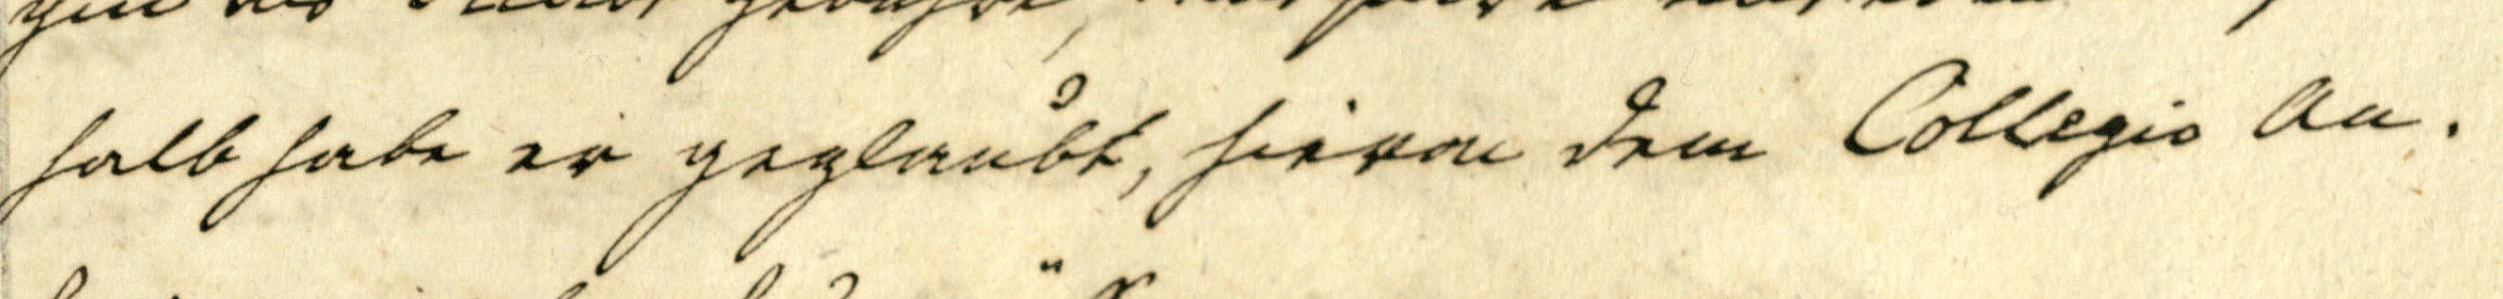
halb habe er geglaubt, hievon dem Collegio An¬
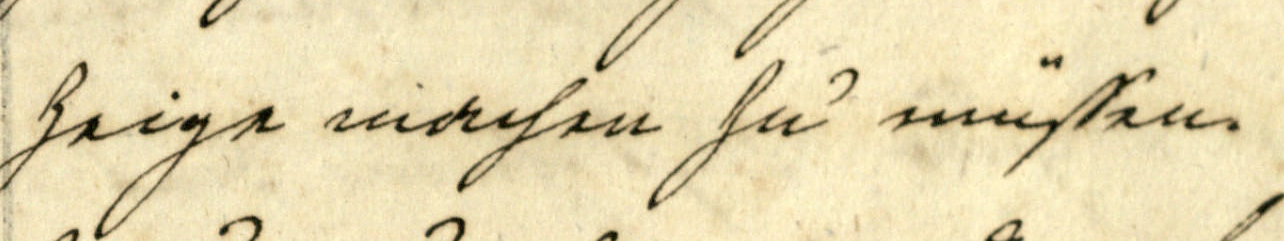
zeige machen zu müssen.
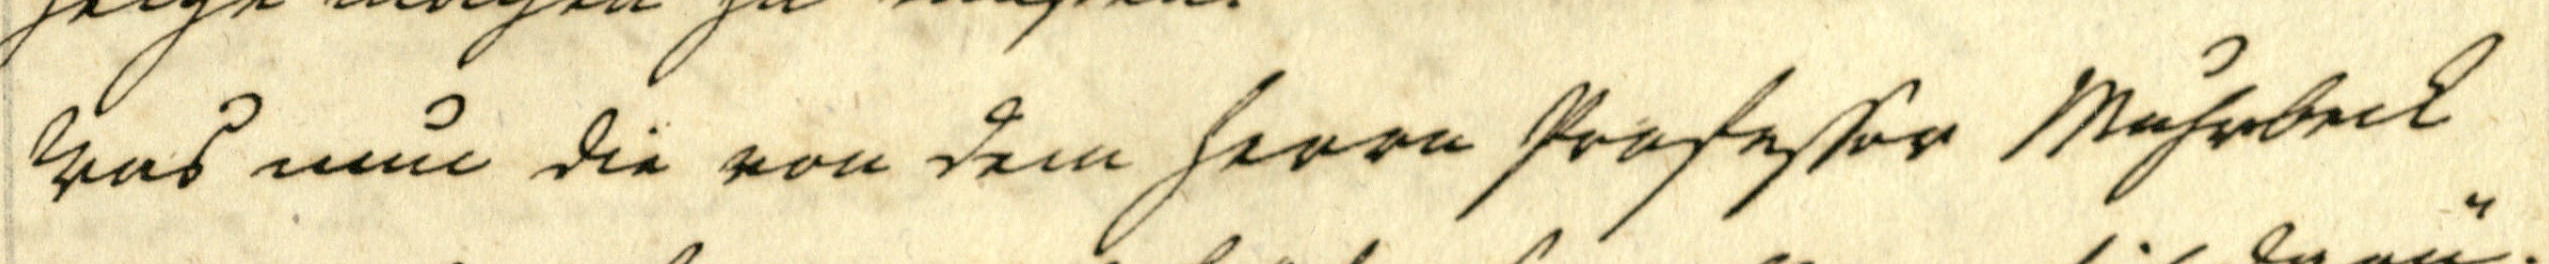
Was nun die von dem Herrn Professor Muhrbeck
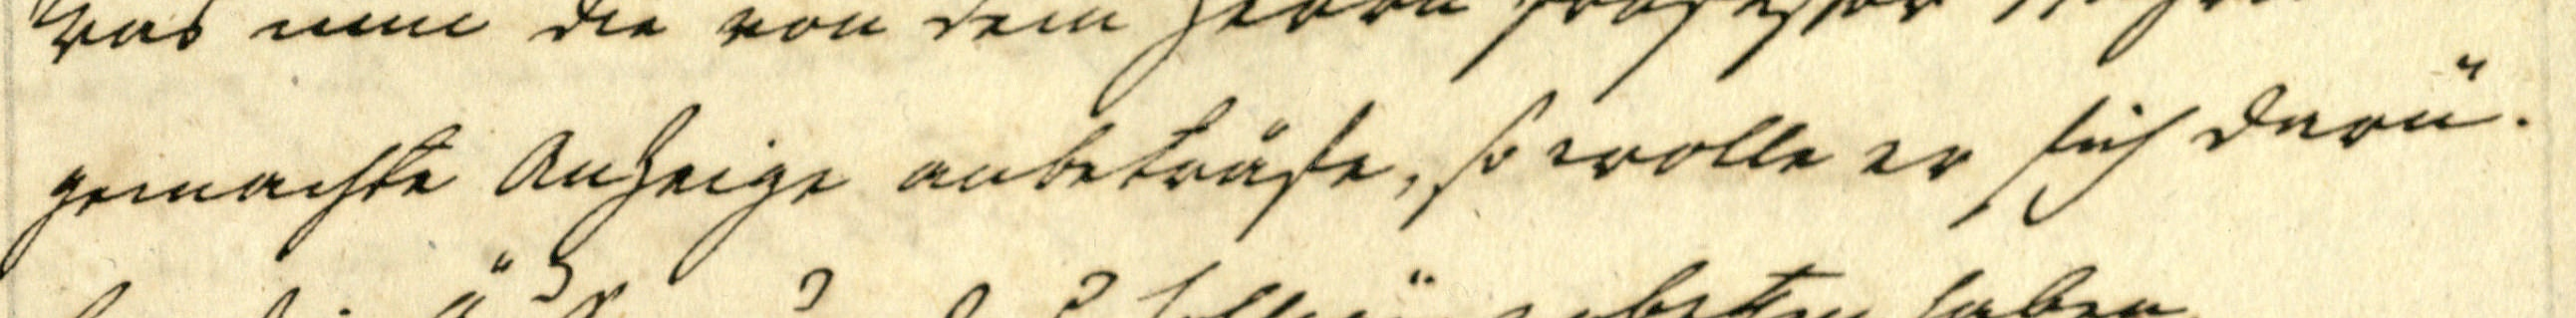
gemachte Anzeige anbeträfe, so wolle er sich darü¬
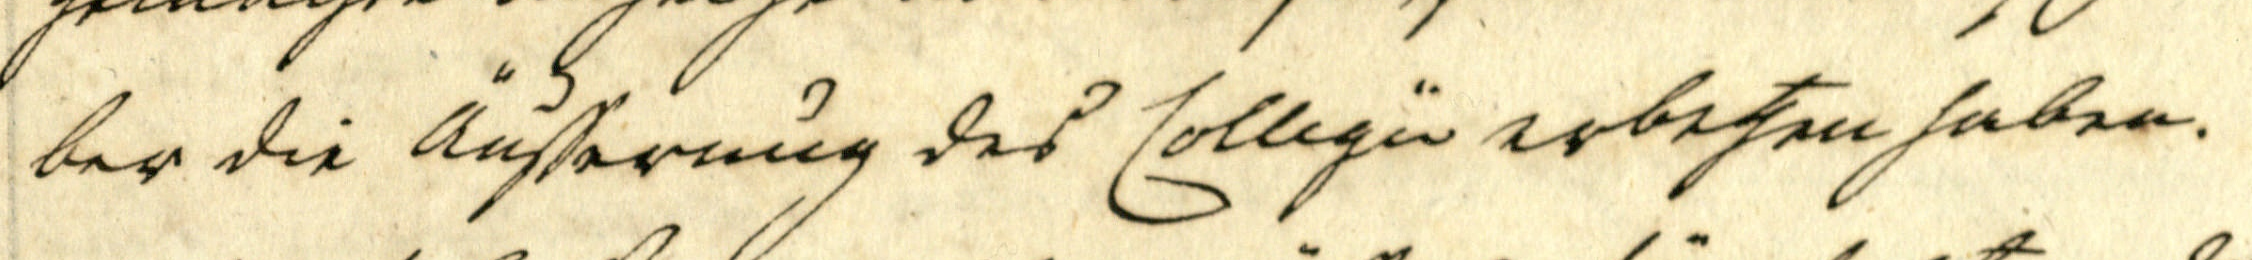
ber die Äusserung des Collegio erbethen haben.
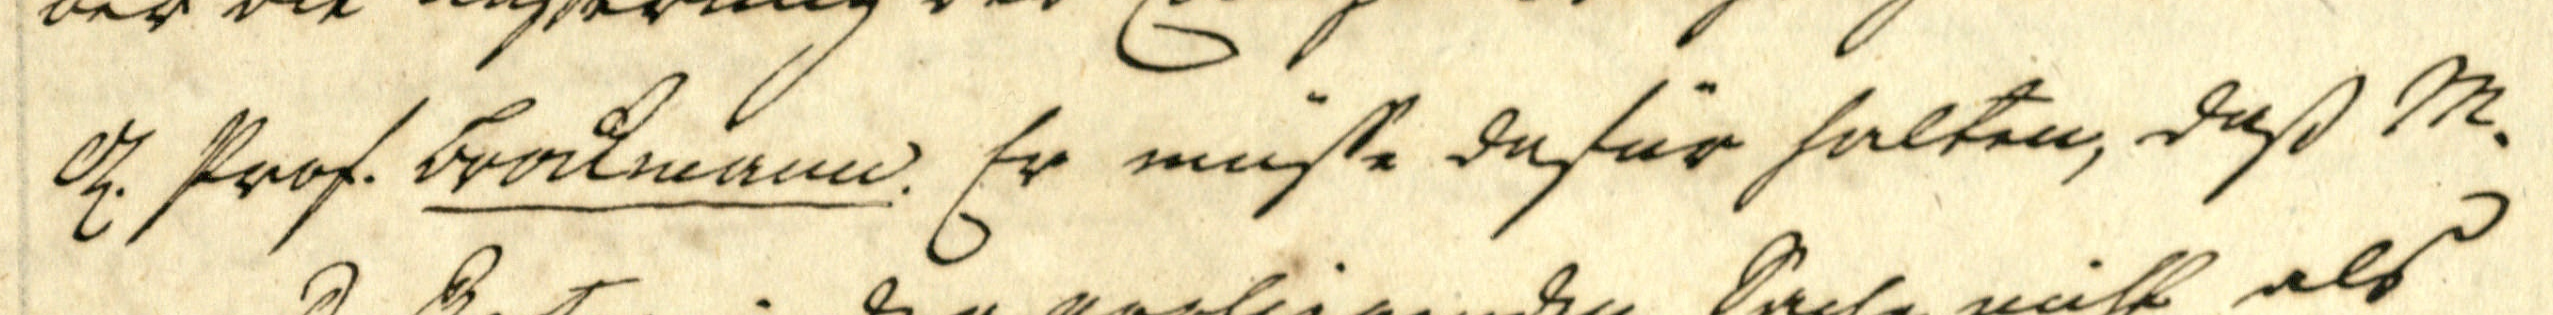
dh. Prof. Brockmann. Er müsse dafür halten, daß M.
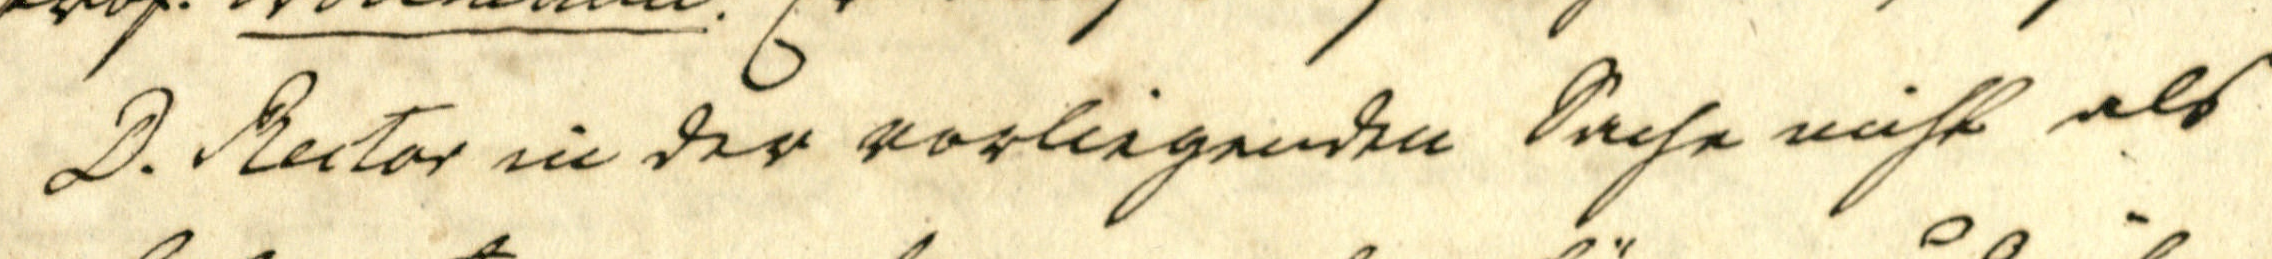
D. Rector in der vorliegenden Sache nicht als
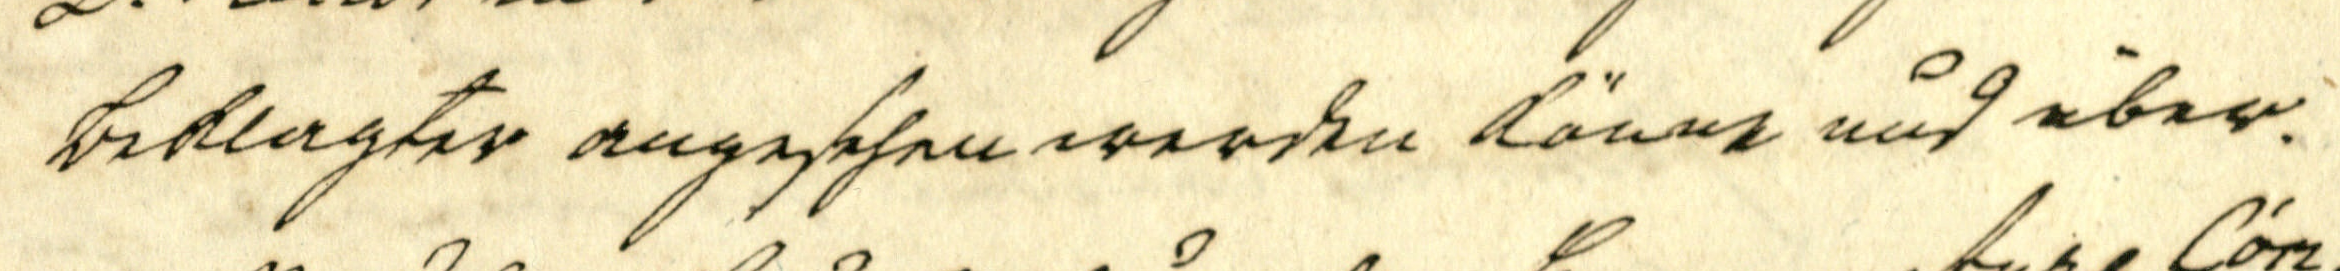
Beklagter angesehen werden könne und über¬
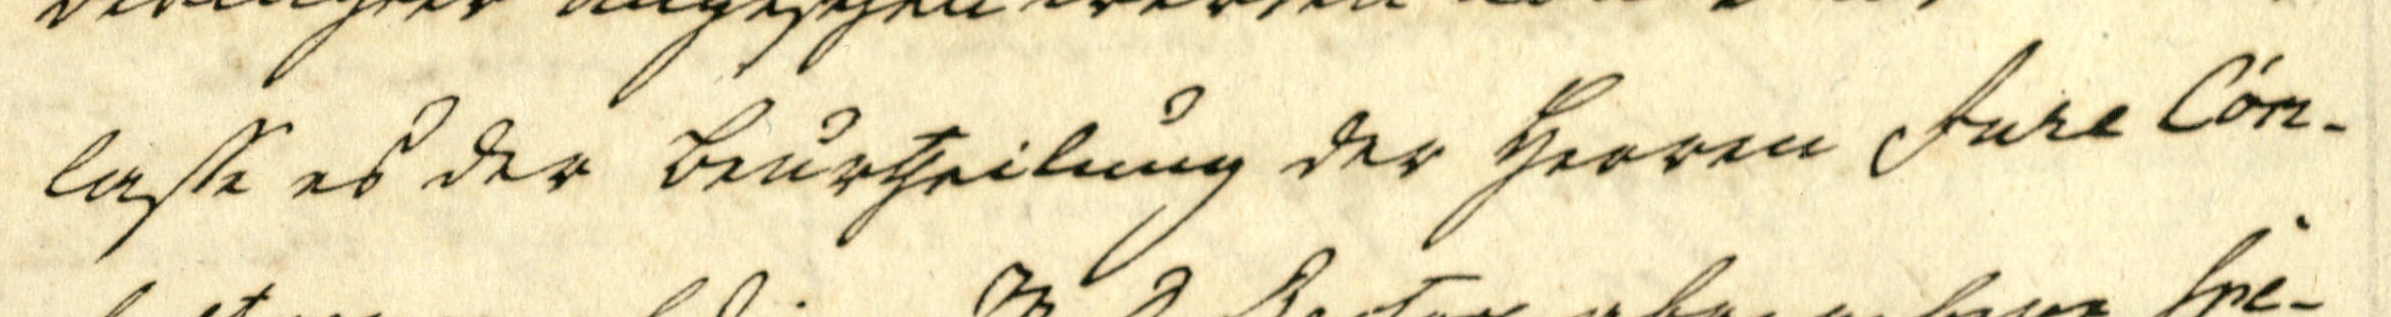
lasse es der Beurtheilung der Herren Jure Con¬
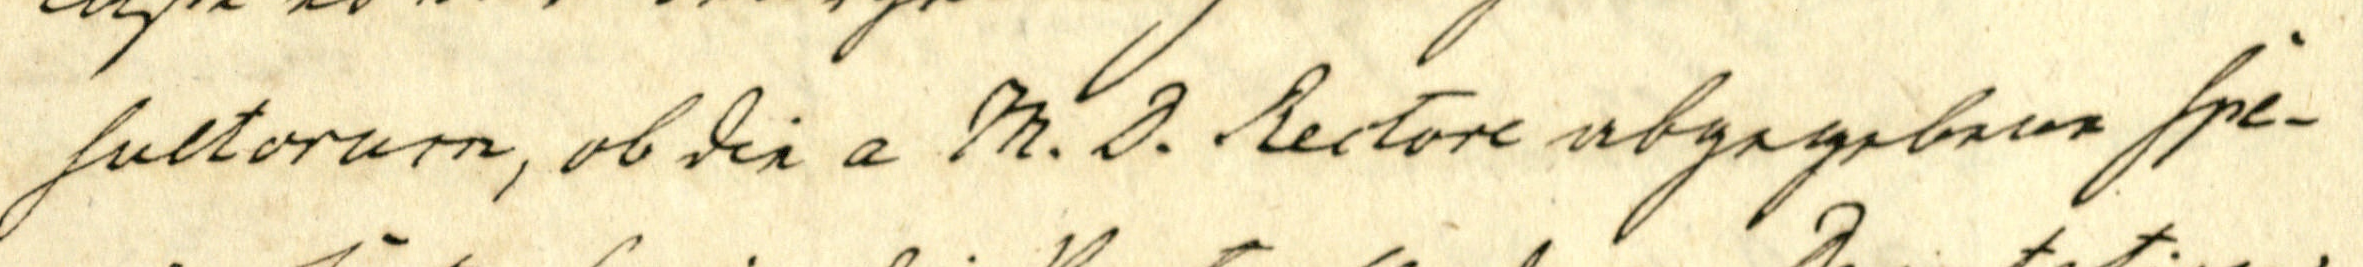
sultorum, ob die a M. D. Rectore abgegebene spe¬
